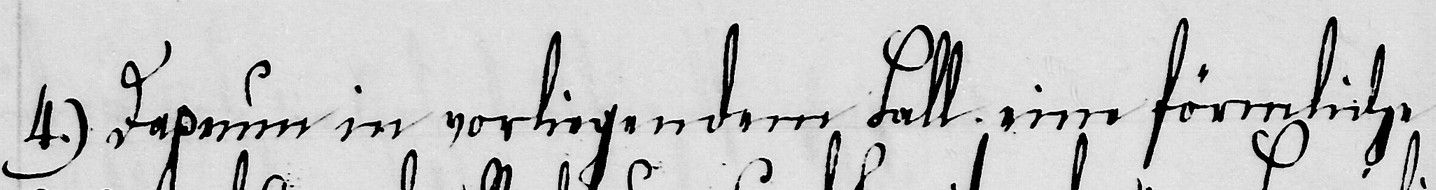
4.) Daßnun in vorliegendem Fall eine förmliche
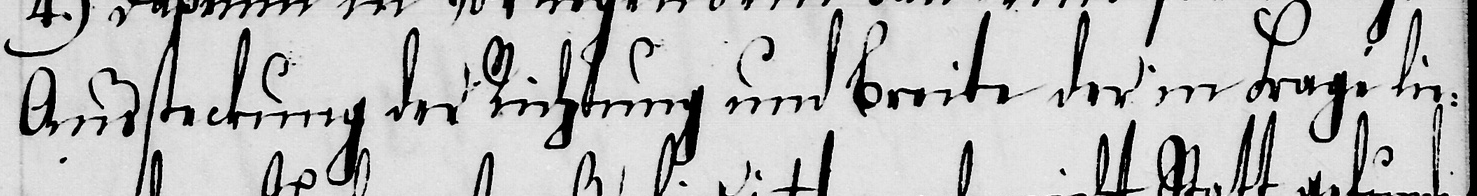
Aussteckung der Richtung und Breite der in Frage lie¬
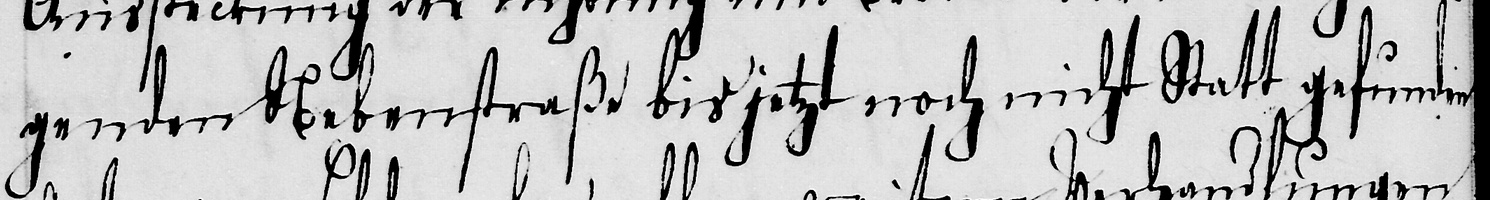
genden Nebenstraße bis jetzt noch nicht Statt gefunden
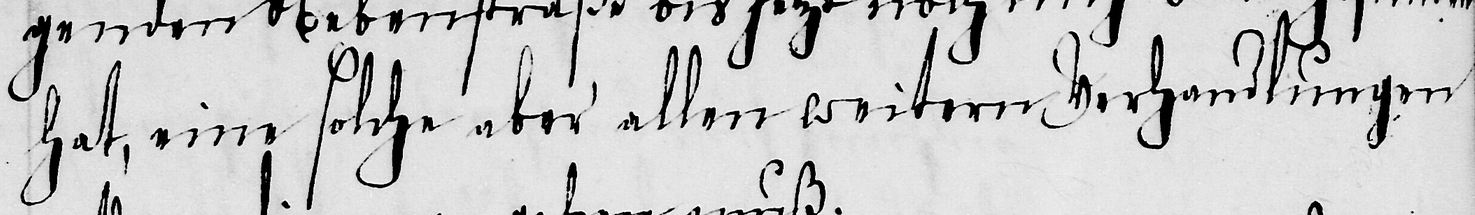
hat, eine solche aber allen weitern Verhandlungen
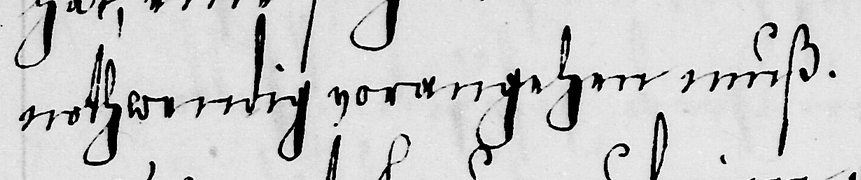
nothwendig vorangehen muß.
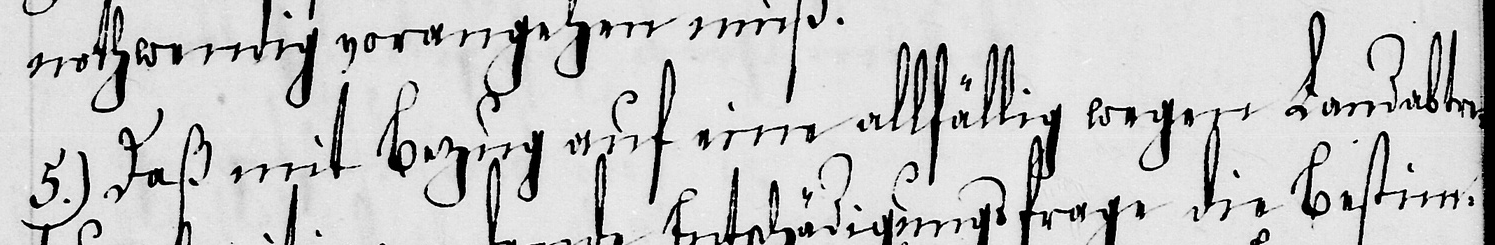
5.) Daß mit Bezug auf eine allfällige wegen Landabtre¬
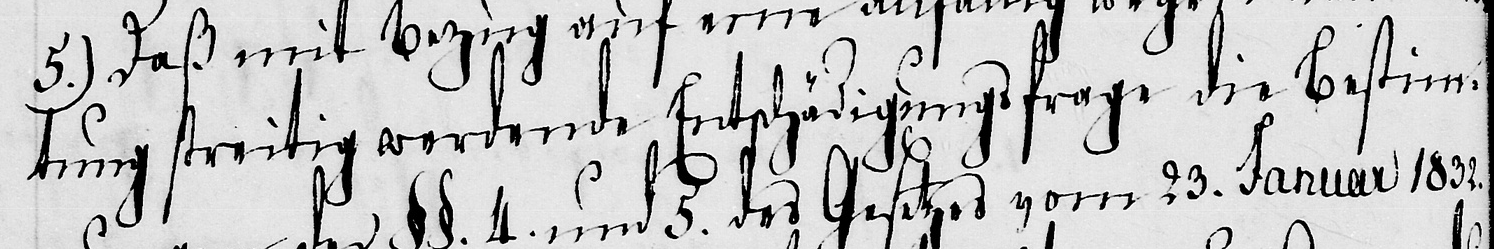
tung streitig werdende Entschädigungsfrage die Bestim¬
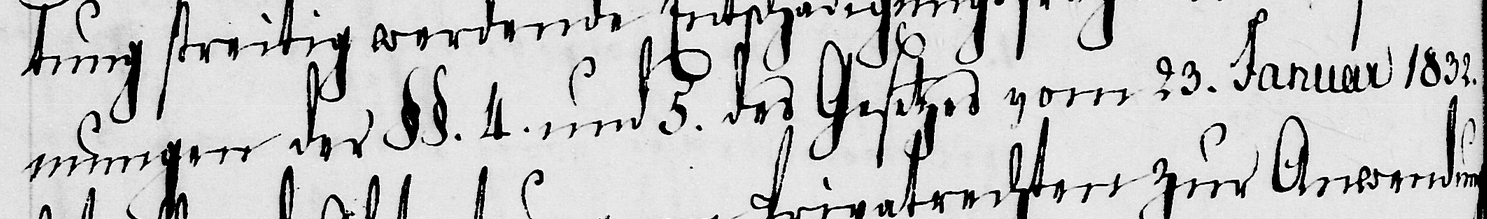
mungen der §§. 4. und 5. des Gesetzes vom 23. Januar 1832.
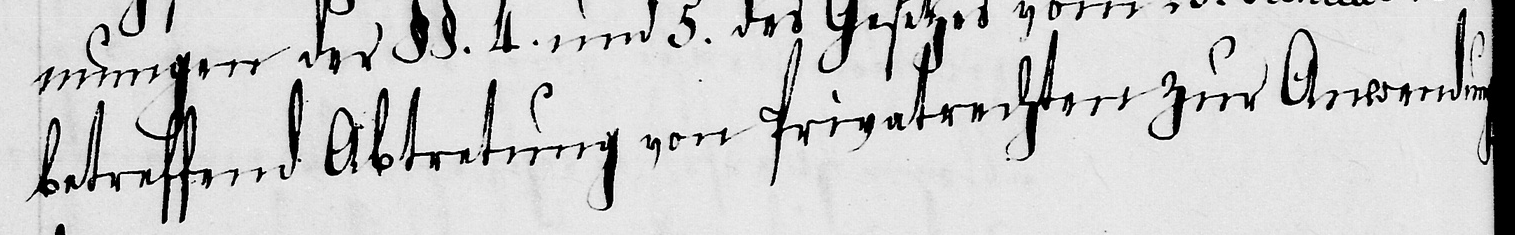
betreffend Abtretung von Privatrechten zur Anwendung
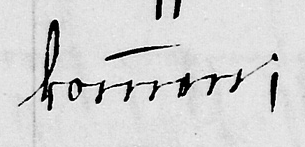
kommen;
